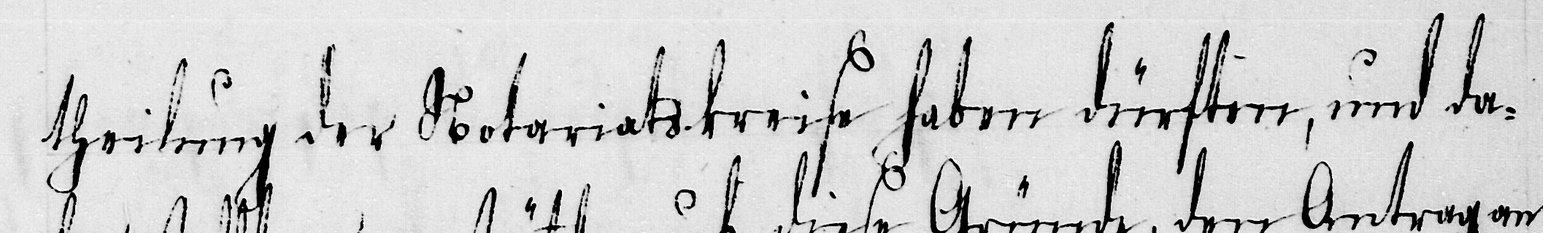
theilung der Notariatskreise haben dürften, und da¬
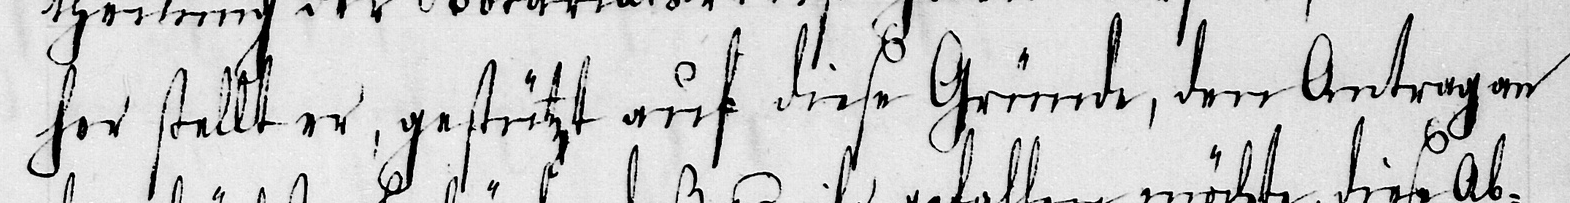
her stellt er, gestützt auf diese Gründe, den Antrag an
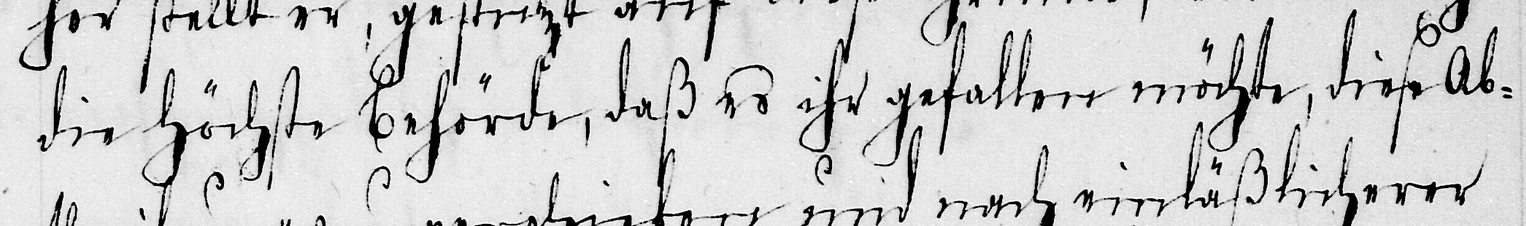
die Höchste Behörde, daß es ihr gefallen möchte, diese Ab¬
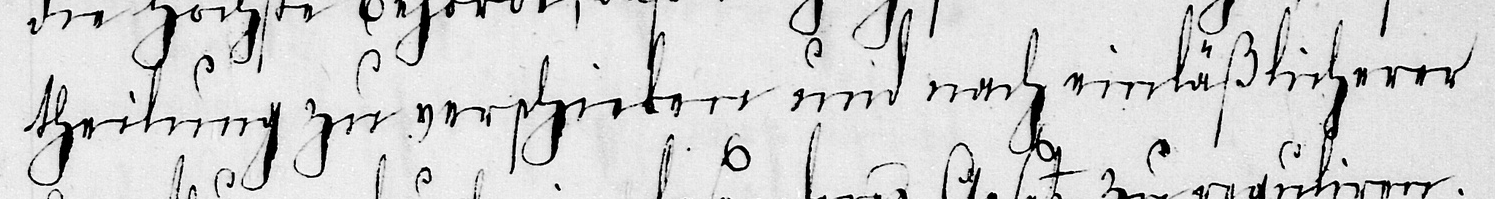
theilung zu verschieben und nach einläßlicherer
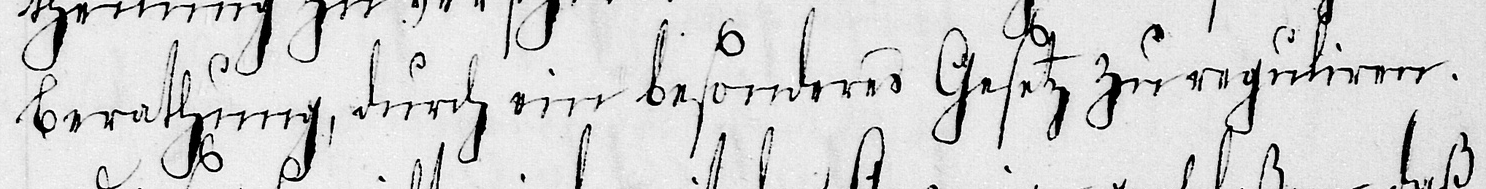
Berathung, durch ein besonderes Gesetz zu reguliren.
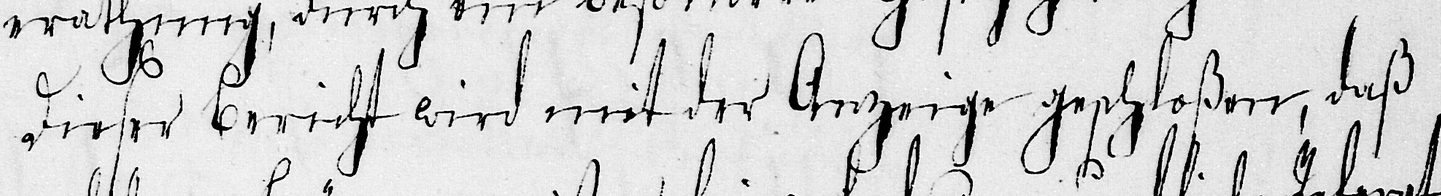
Dieser Bericht wird mit der Anzeige geschloßen, daß
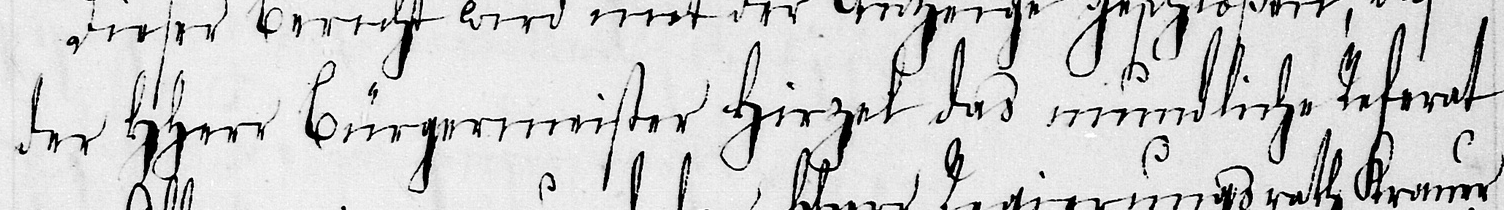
der HHerr Bürgermeister Hirzel das mundliche Referat
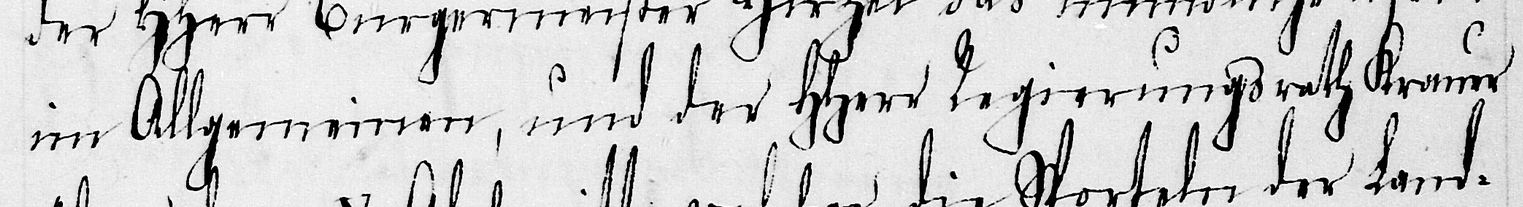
im Allgemeinen, und der HHerr Regierungsrath Krauer
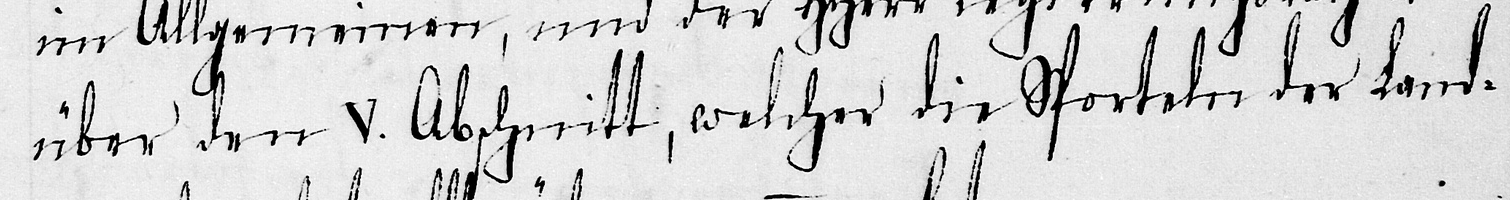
über den V. Abschnitt, welcher die Sporteln der Land¬
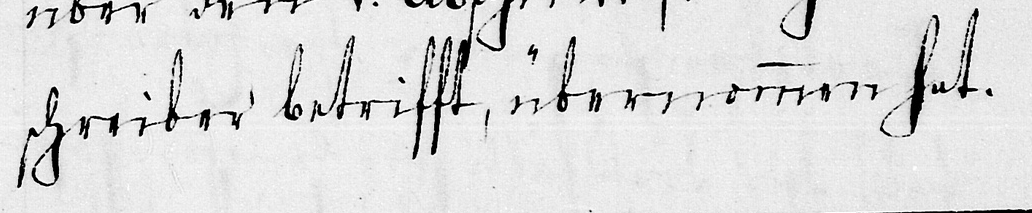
schreiber betrifft, übernommen hat.
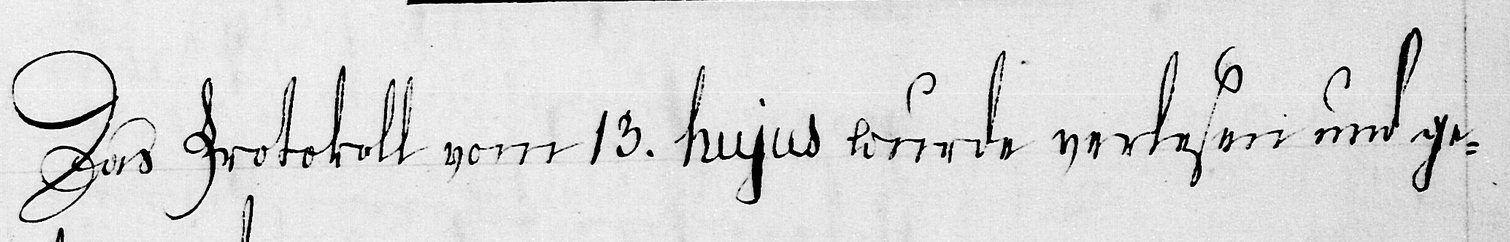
Das Protokoll vom 13. hujus wurde verlesen und ge¬
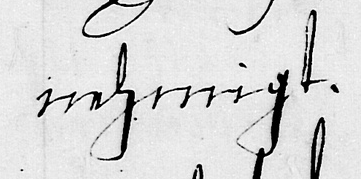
nehmigt.
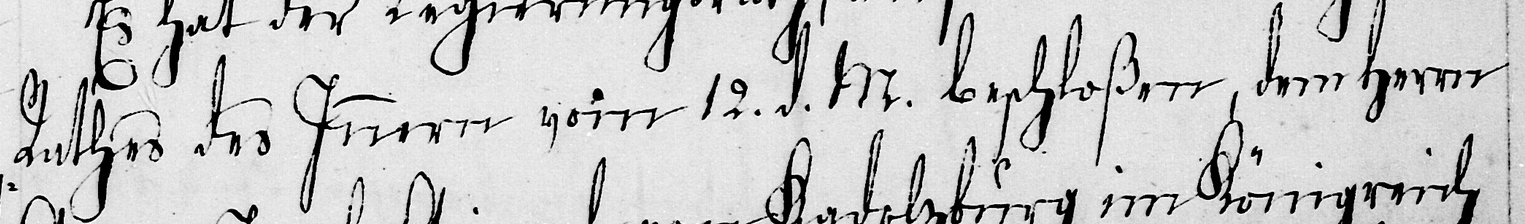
Rathes des Innern vom 12. d. M. beschloßen, dem Herrn
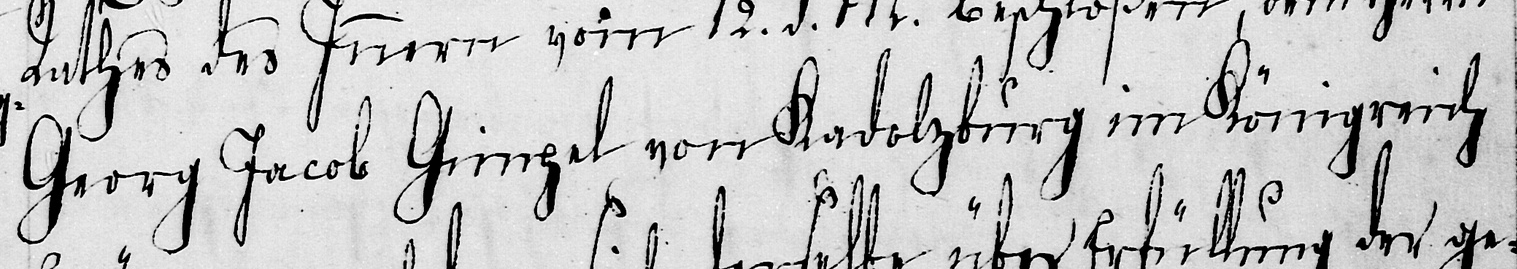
Georg Jacob Gimpel von Kadolzburg im Königreich
